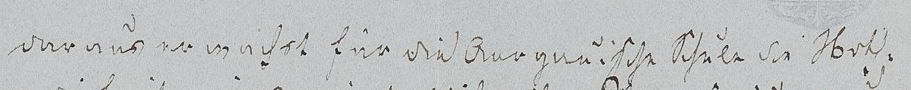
Daraus erwächst für die Aargauische Schule die Noth-
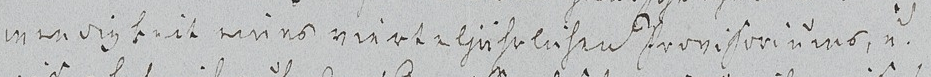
wendigkeit eines vierteljährlichen Provisoriums, u.
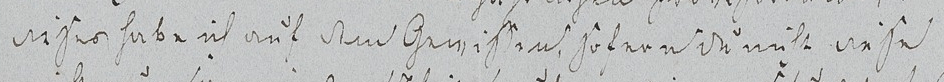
dieses habe ich auf dem Gewissen, sofern du nicht diese
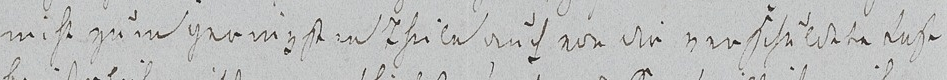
nicht zum geringsten Theile auch von dir verschuldete Last
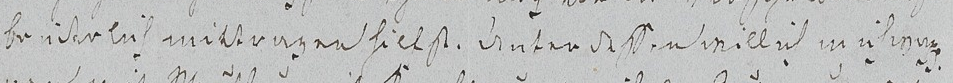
brüderlich mittragen hilfst. Unterdessen will ich mich wapp-
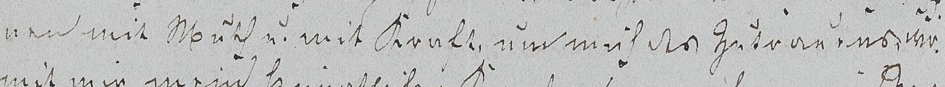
nen mit Muth u. mit Kraft, um mich des Zutrauens, wo-
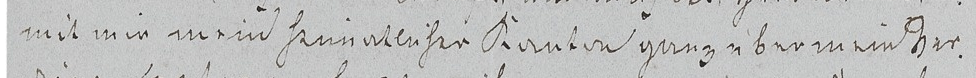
mit mir mein heimatlicher Kanton ganz über mein Ver-
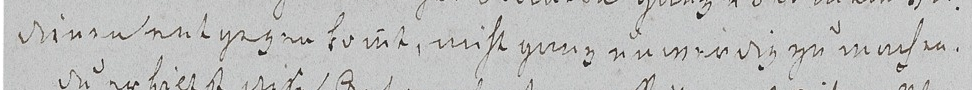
dienen entgegenkommt, nicht ganz unwürdig zu machen.
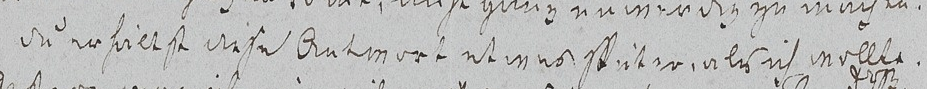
Du erhältst diese Antwort etwas später, als ich wollte.
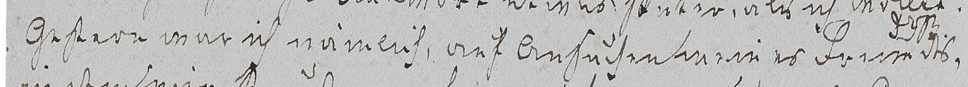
Gestern war ich nämlich, auf Ansuchen meines Freundes DrB.,
